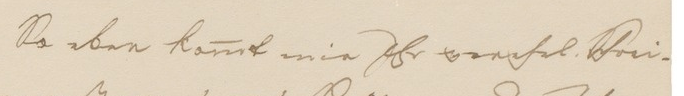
So eben kommt mir Ihr verehrl. Schrei-
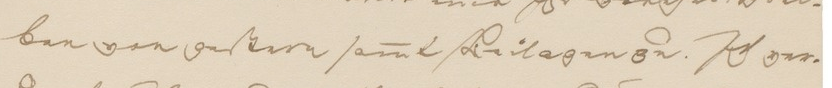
ben von gestern sammt Beilagen zu. Ich ver-
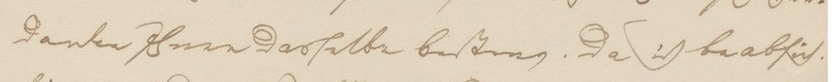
danke Ihnen dasselbe bestens. Da ich beabsich-
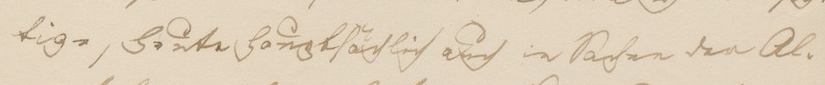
tige, heute hauptsächlich auch in Sachen der Al-
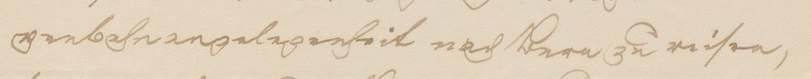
penbahnangelegenheit nach Bern zu reisen,
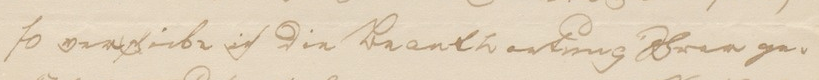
so verschiebe ich die Beantwortung Ihrer ge-
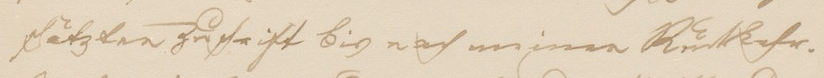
schätzten Zuschrift bis nach meiner Rückkehr.
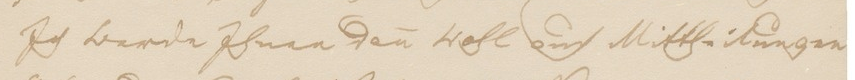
Ich werde Ihnen dann wohl auch Mittheilungen
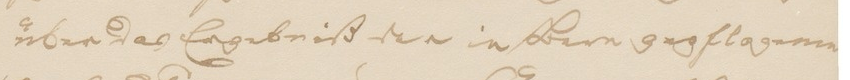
über das Ergebniß der in Bern gepflogenen
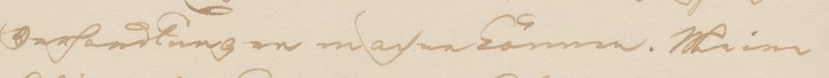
Verhandlungen machen könnnen. Meine
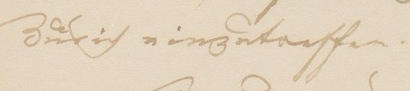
Zürich einzutreffen.
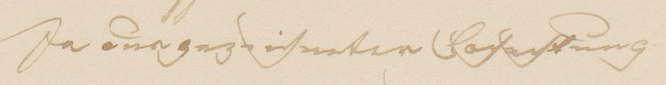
In ausgezeichneter Hochachtung
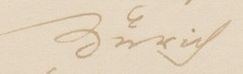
Zürich
